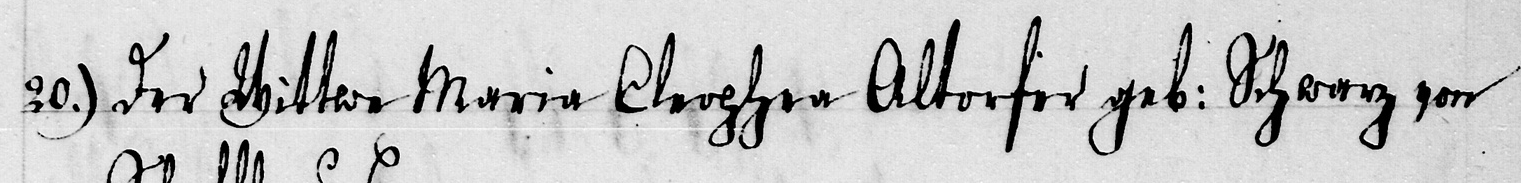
20.) Der Wittwe Maria Cleophea Altorfer geb: Schwarz von
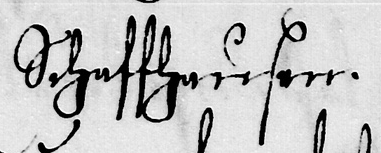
Schaffhausen.
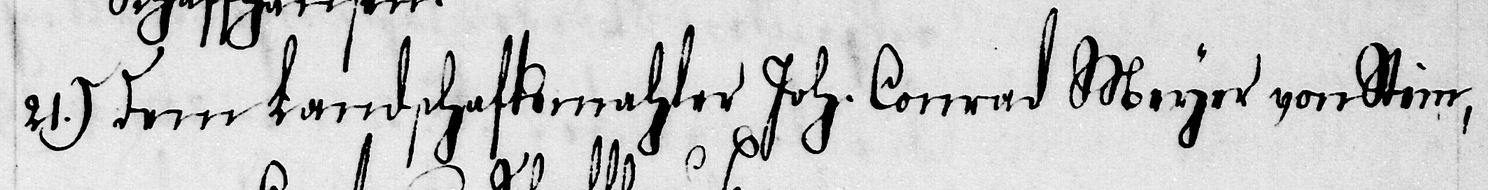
21.) Dem Landschaftsmahler Joh. Conrad Meyer von Stein,
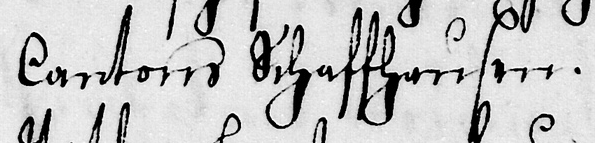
Cantons Schaffhausen.
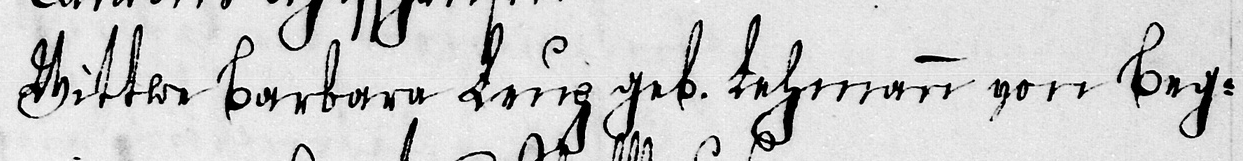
Wittwe Barbara Leup geb. Lehmann von Beg¬
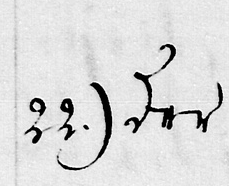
22.) Der
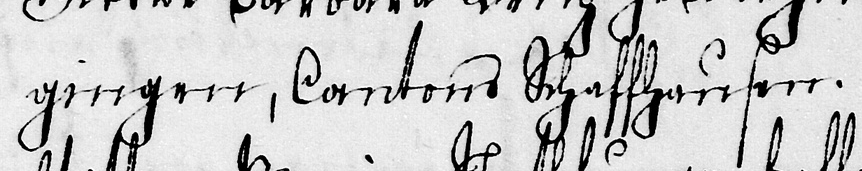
gingen, Cantons Schaffhausen.
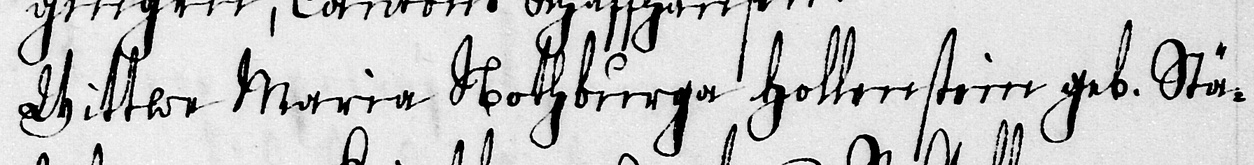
Wittwe Maria Nothburga Hollenstein geb. Stä¬
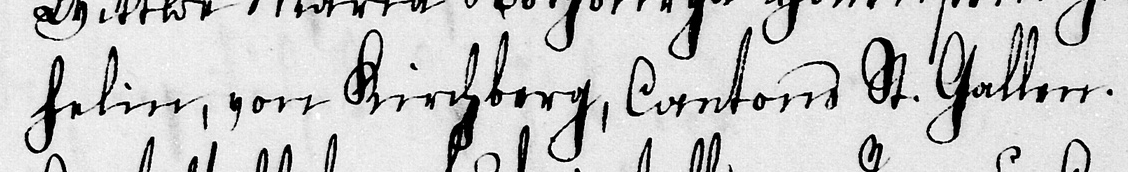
helin, von Kirchberg, Cantons St. Gallen.
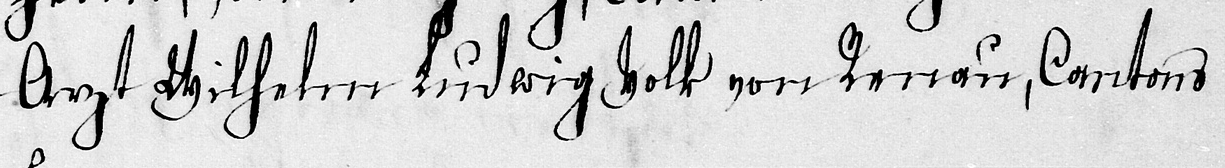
Arzt Wilhelm Ludwig Volk von Knonau, Cantons
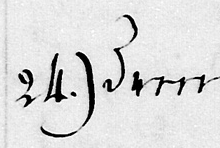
24.) Dem
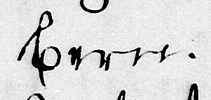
Bern.
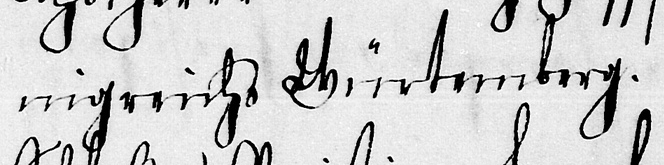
nigreichs Würtemberg.
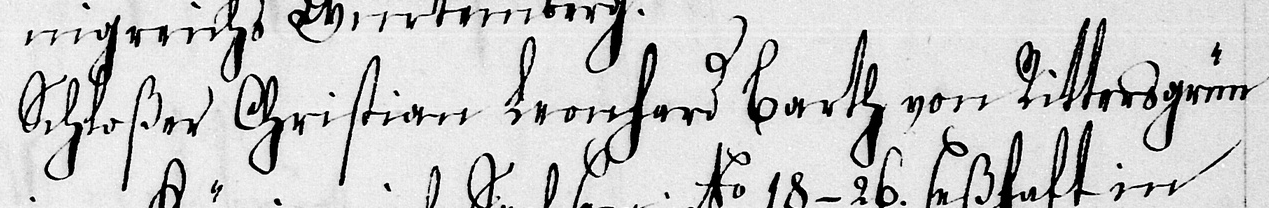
Schloßer Christian Leonhard Barth von Rittersgrün
